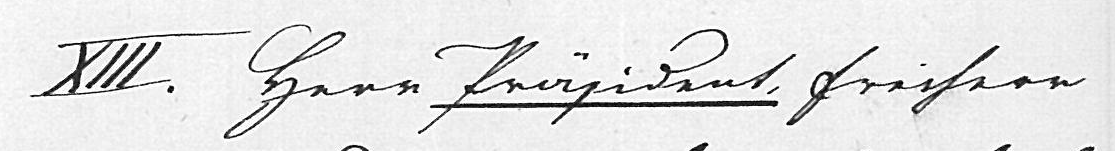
XIII. Herr Präsident, Freiherr
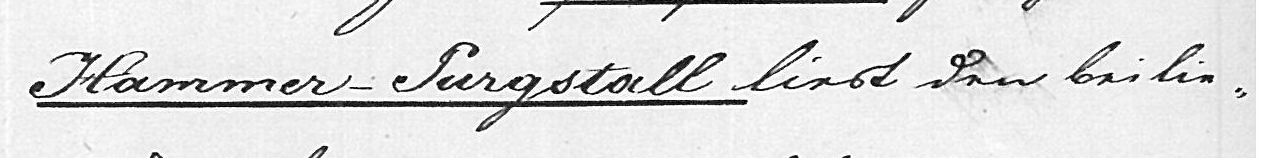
Hammer-Purgstall liest den beilie-
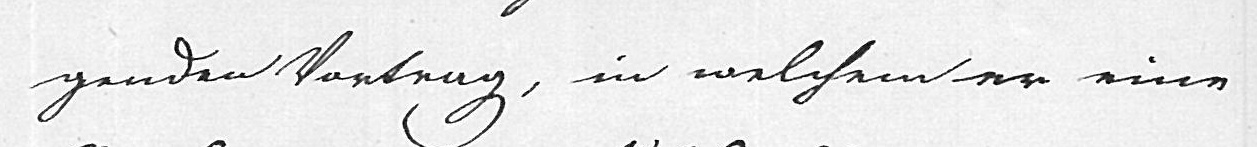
genden Vortrag, in welchem er eine
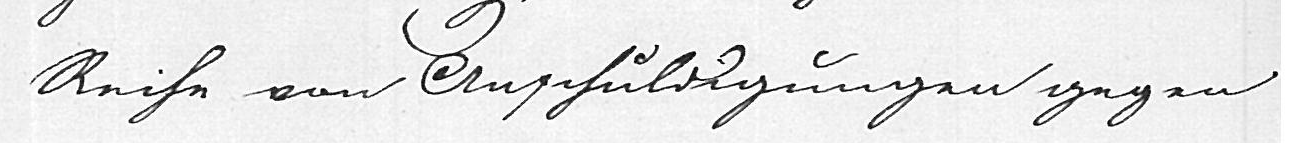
Reihe von Anschuldigungen gegen
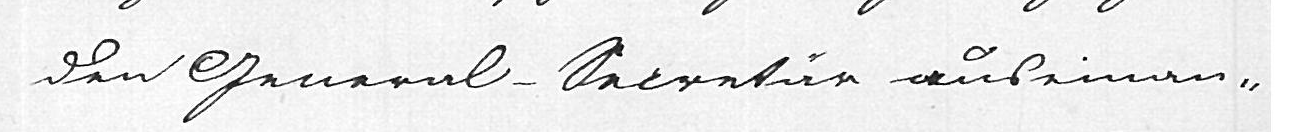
den General-Secretär auseinan-
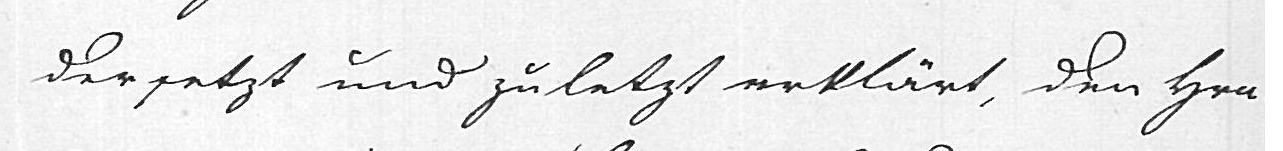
dersetzt und zuletzt erklärt, den Hrn.
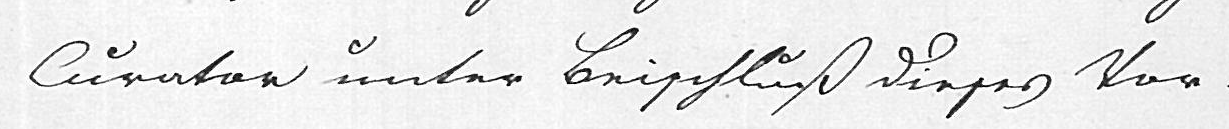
Curator unter Beischluß dieses Vor-
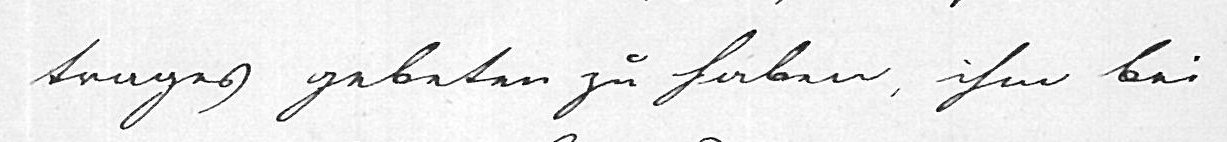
trages gebeten zu haben, ihm bei
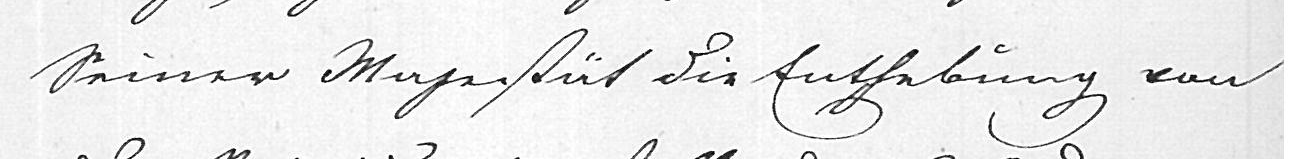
Seiner Majestät die Enthebung von
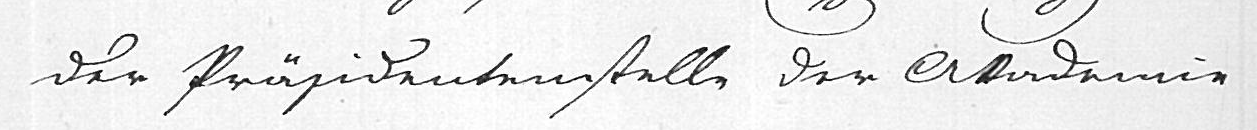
der Präsidentenstelle der Akademie
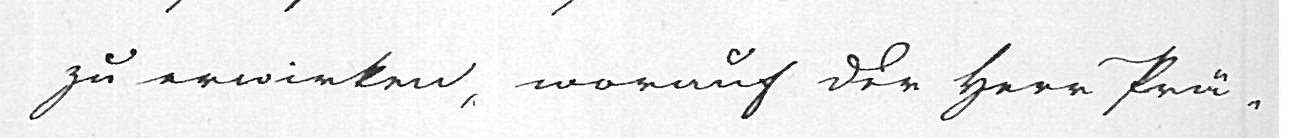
zu erwirken, worauf der Herr Prä-
